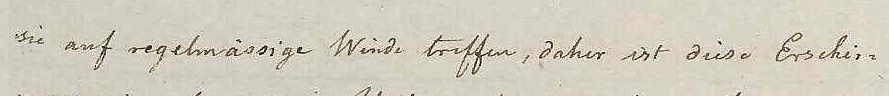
sie auf regelmässige Winde treffen, daher ist diese Erschei-
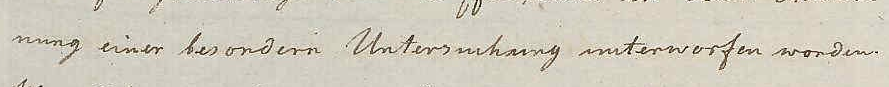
nung einer besondern Untersuchung unterworfen worden.
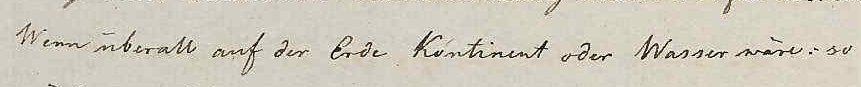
Wenn überall auf der Erde Kontinent oder Wasser wäre: so
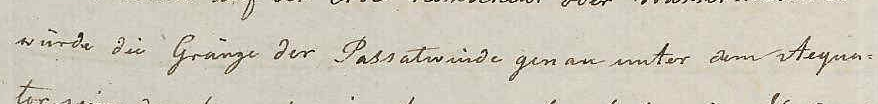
würde die Gränze der Passatwinde genau unter dem Aequa-
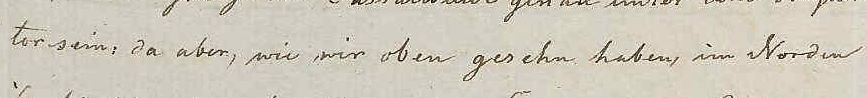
tor sein: da aber, wie wir oben gesehn haben, im Norden
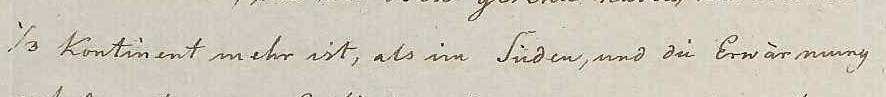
⅓ Kontinent mehr ist, als im Süden, und die Erwärmung
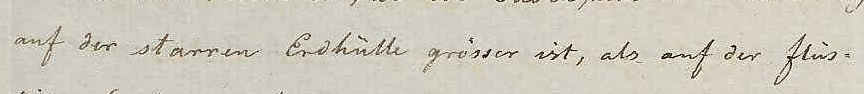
auf der starren Erdhülle grösser ist, als auf der flüs-
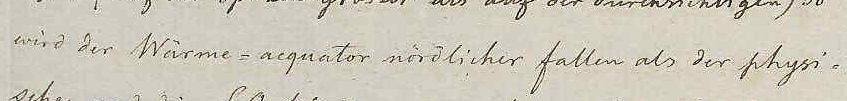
wird der Wärme-aequator nördlicher fallen als der physi-
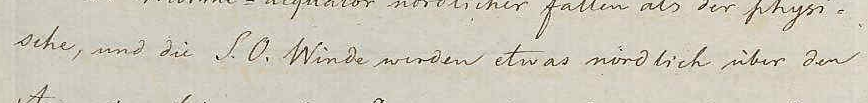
sche, und die S. O. S.-O.-Winde werden etwas nördlich über den
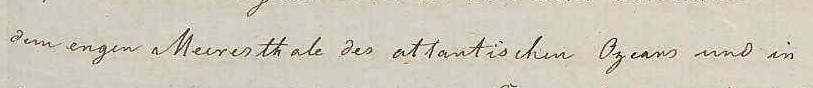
dem engen Meeresthale des atlantischen Ozeans und in
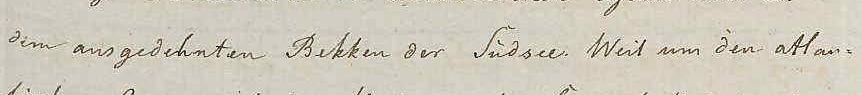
dem ausgedehnten Bekken der Südsee. Weil um den atlan-
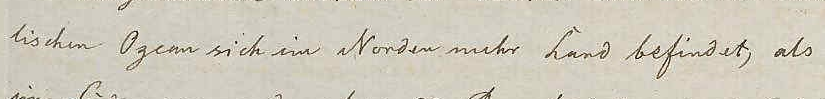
tischen Ozean sich im Norden mehr Land befindet, als
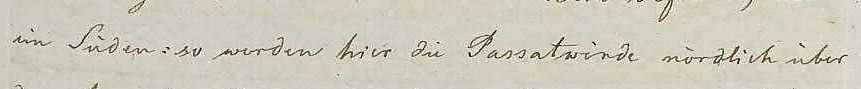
im Süden: so werden hier die Passatwinde nördlich über
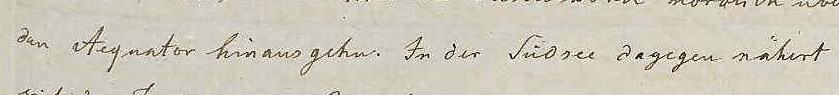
den Aequator hinausgehn. In der Südsee dagegen nähert
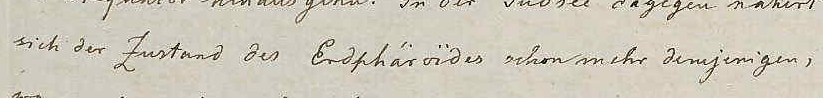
sich der Zustand des schon mehr demjenigen,
